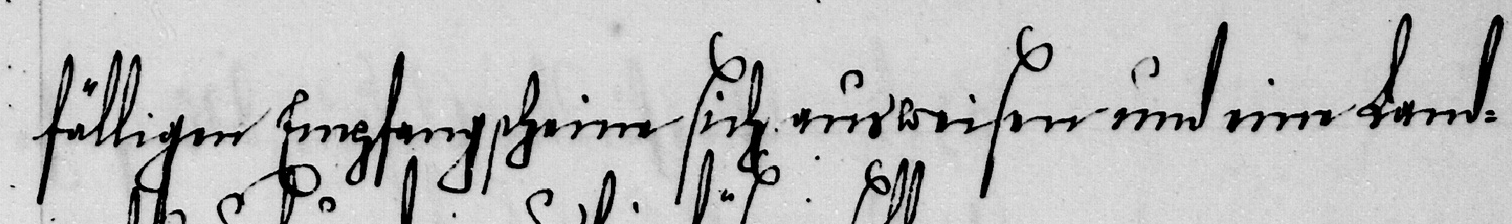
fälligen Empfangscheine sich ausweisen und eine Land¬
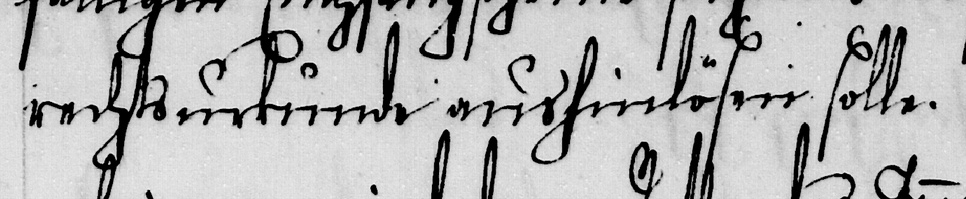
rechtsurkunde aushinlösen solle.
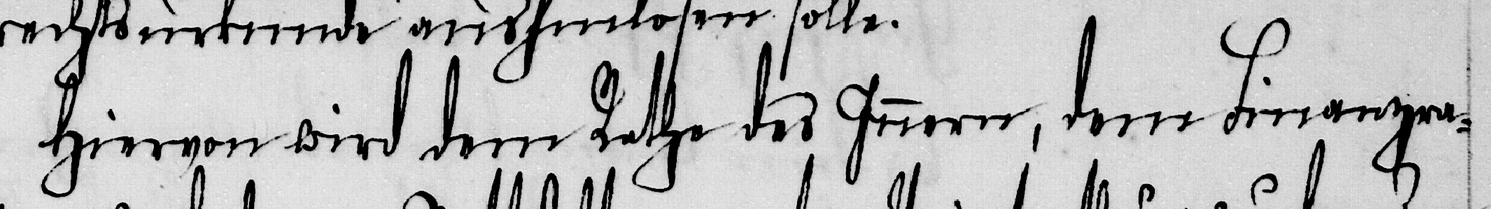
Hiervon wird dem Rathe des Innern, dem Finanzra¬
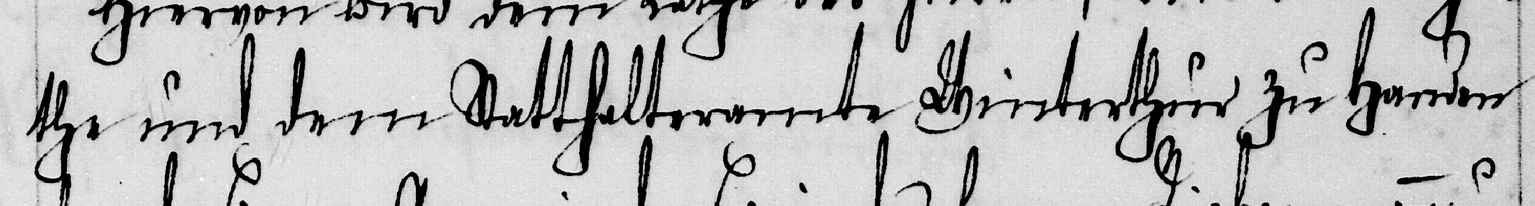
the und dem Statthalteramte Winterthur zu Handen
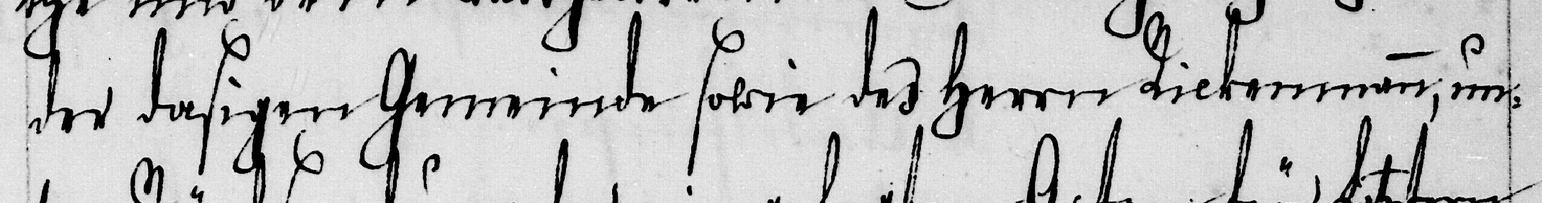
der dasigen Gemeinde sowie des Herrn Rickenmann, un¬
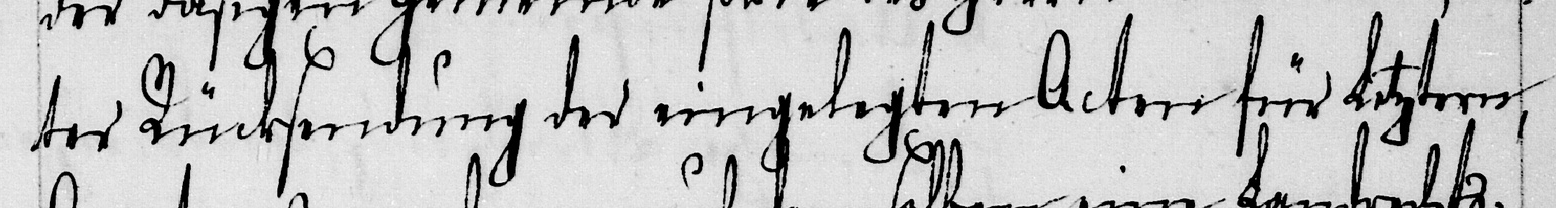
ter Rücksendung der eingelegten Acten für Letztern,
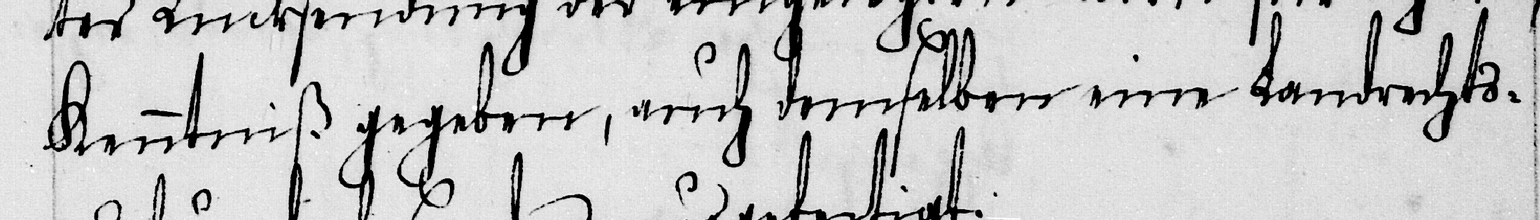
Kenntniß gegeben, auch demselben eine Landrechts¬
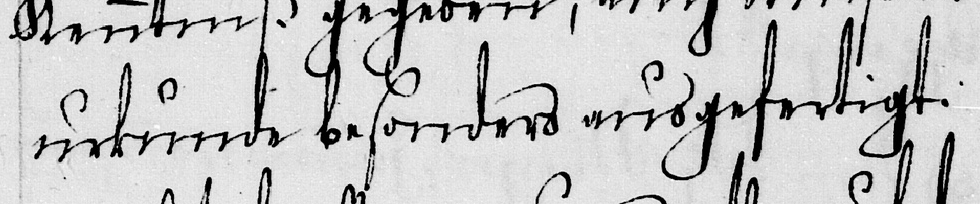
urkunde besonders ausgefertigt.
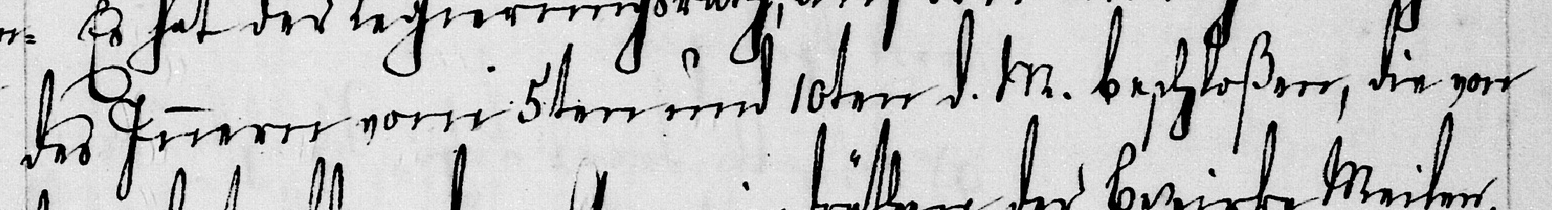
des Innern vom 5ten und 10ten d. M. beschloßen, die von
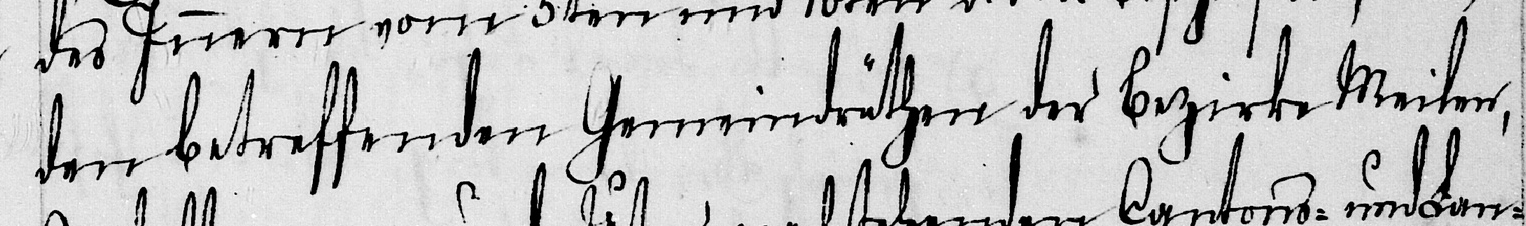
den betreffenden Gemeindräthen der Bezirke Meilen,
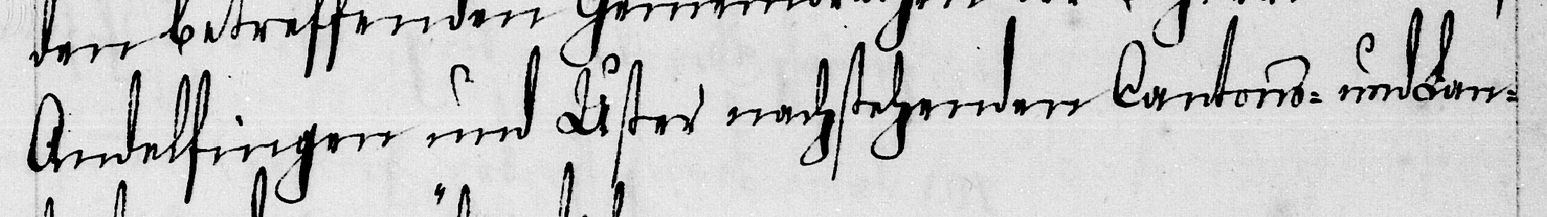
Andelfingen und Uster nachstehenden Cantons- und Lan¬
